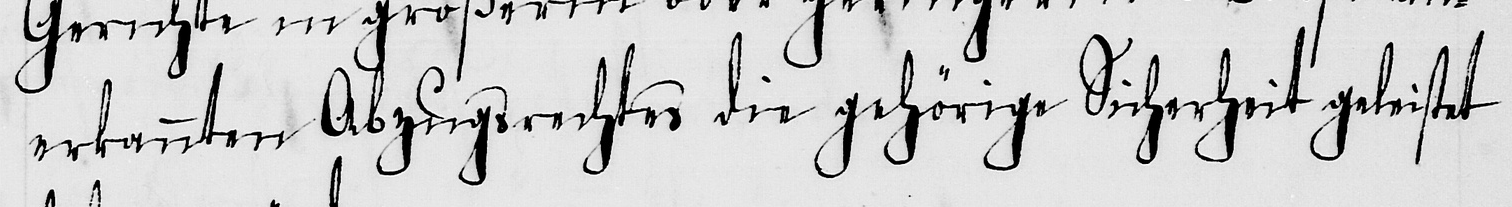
erkannten Abzugsrechtes die gehörige Sicherheit geleistet
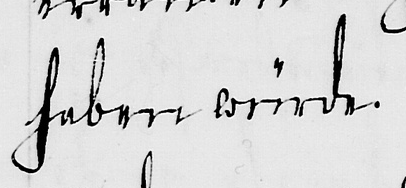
haben würde.
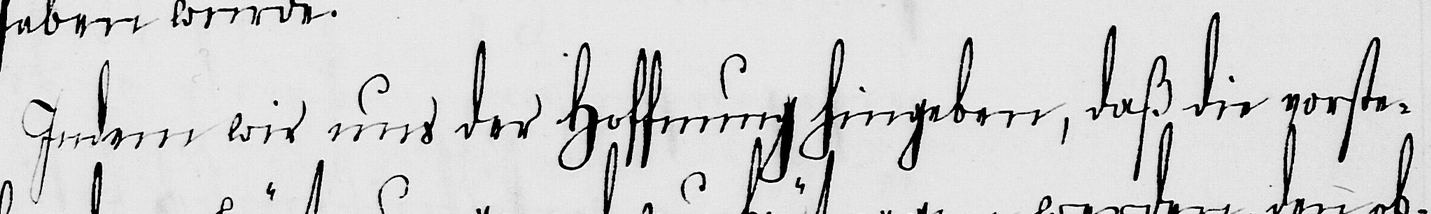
Indem wir uns der Hoffnung hingeben, daß die vorste¬
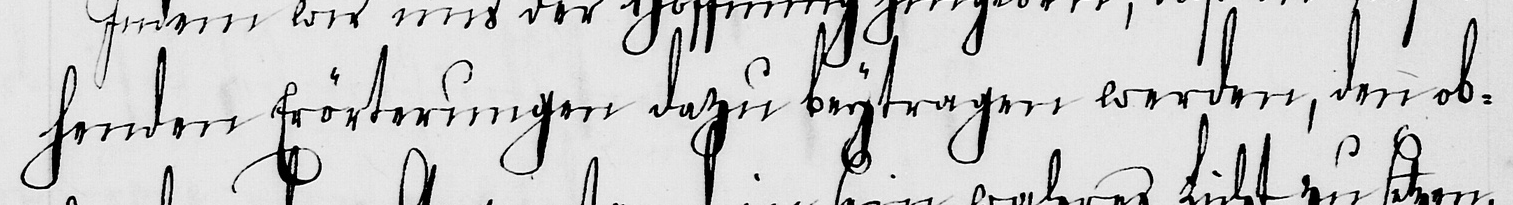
henden Erörterungen dazu beytragen werden, den ob¬
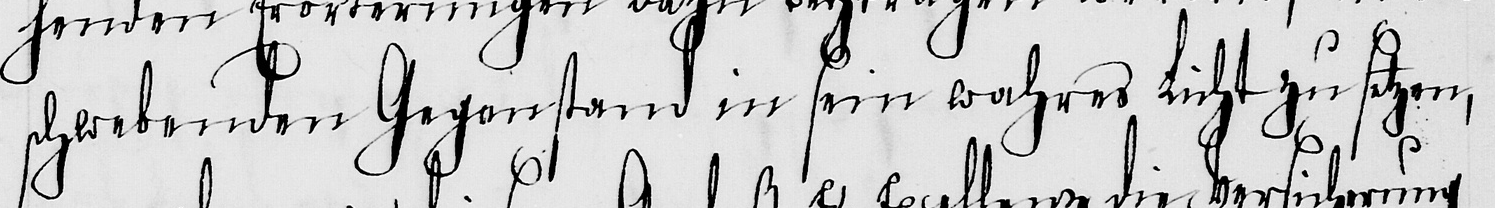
schwebenden Gegenstand in sein wahres Licht zu setzen,
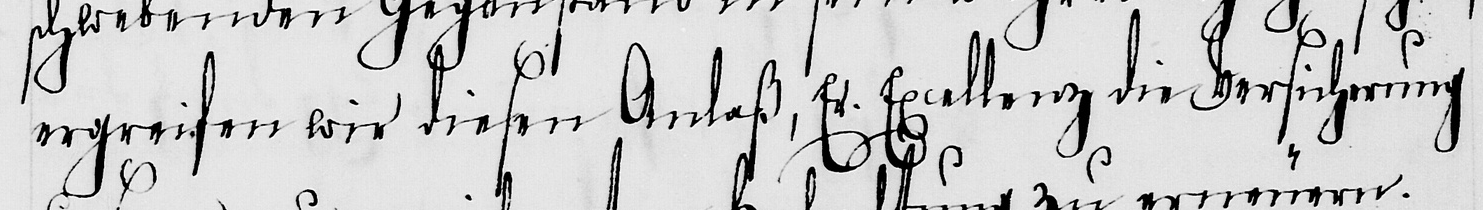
ergreifen wir diesen Anlaß, Er. Excellenz die Versicherung
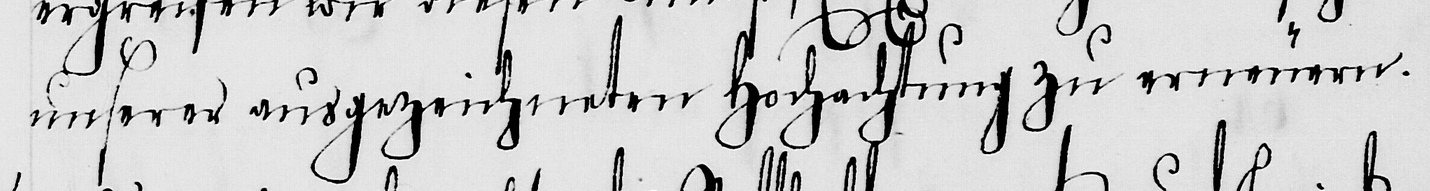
unserer ausgezeichneten Hochachtung zu erneuern.
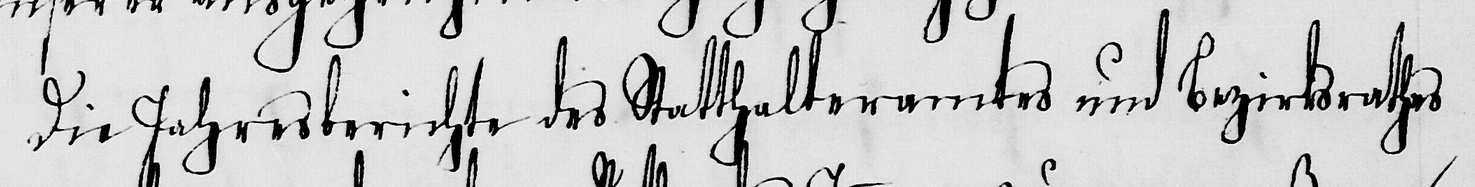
Die Jahresberichte des Statthalteramtes und Bezirksrathes
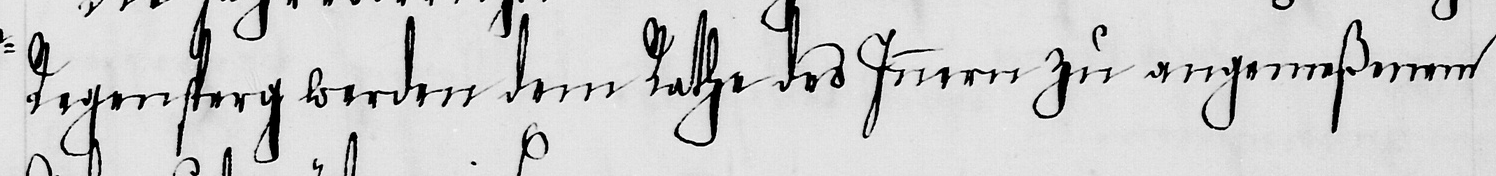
Regensperg werden dem Rathe des Innern zu angemeßenem
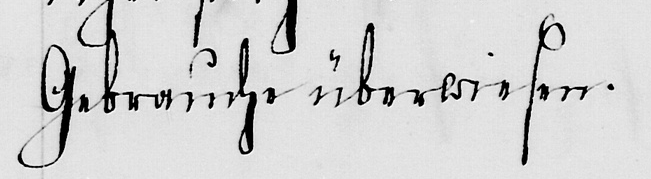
Gebrauche überwiesen.
